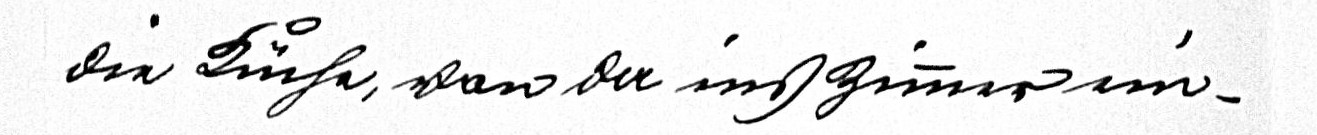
die Küche, von der ins Zimmer ein¬
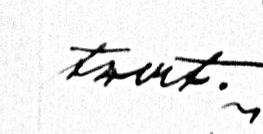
trat.
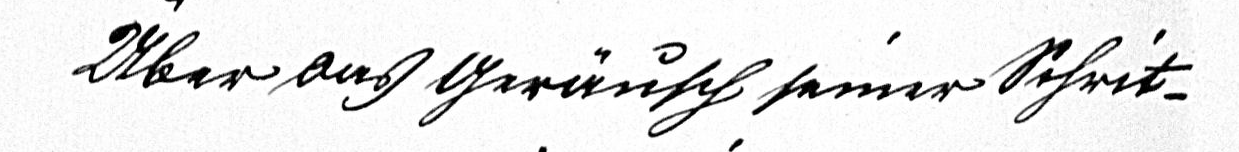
Über das Geräusch seiner Schrit¬
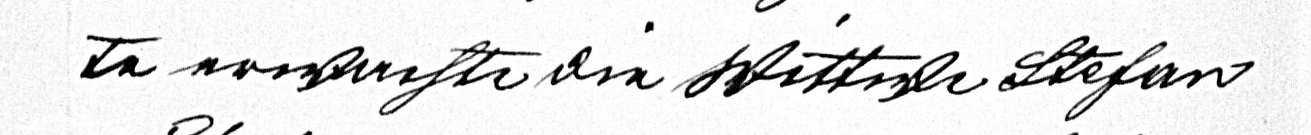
te erwachte die Wittwe Stefan
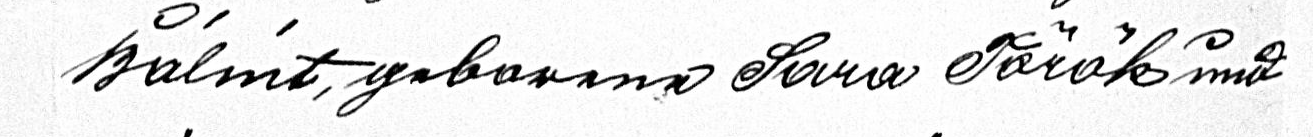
Bálint, geborene Sara Török und
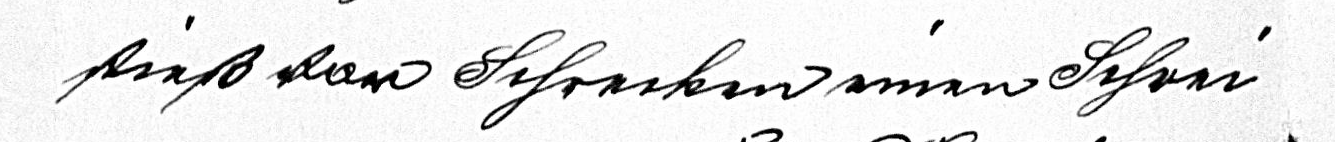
stieß vor Schrecken einen Schrei¬
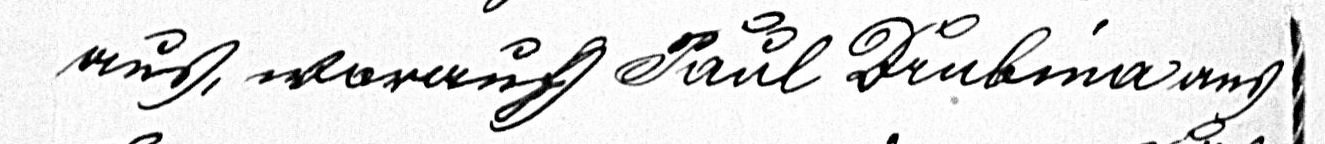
aus, worauf Paul Drubina ans
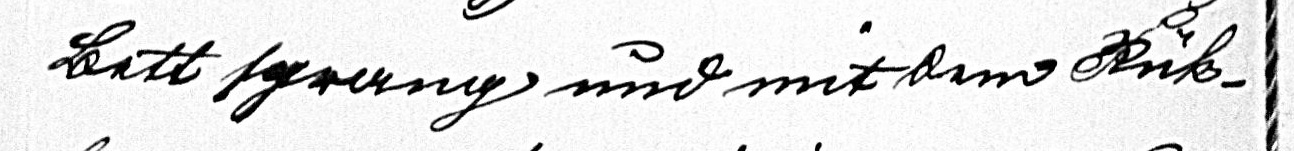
Bett sprang und mit dem Rük¬
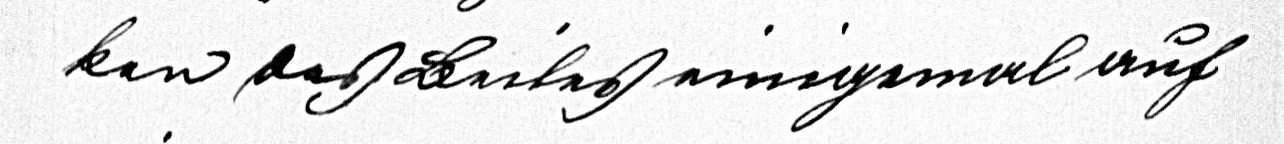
ken des Beiles einigemal auf
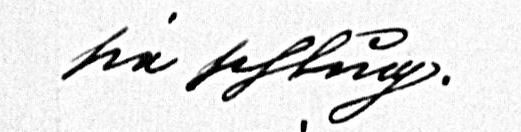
sie schlug.
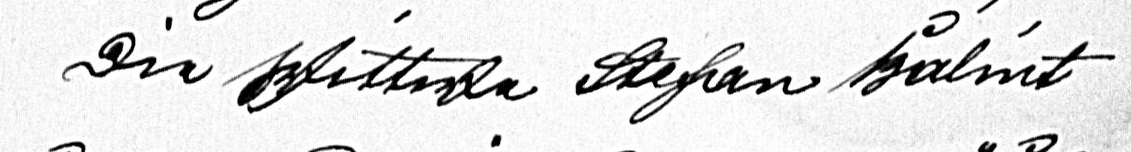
Die Wittwe Stefan Bálint
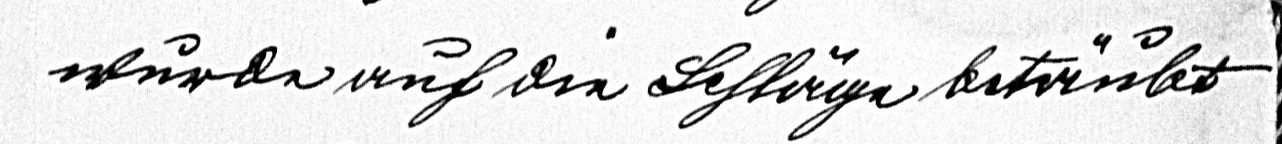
wurde auf die Schläge betäubt
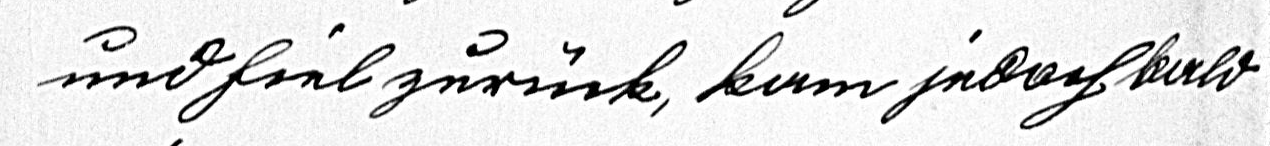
und fiel zurück, kam jedoch bald
